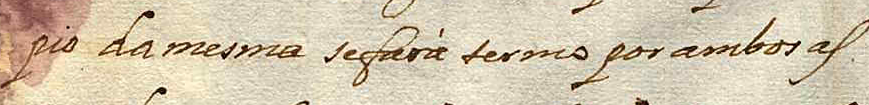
pio da mesma se fará termo por ambos as
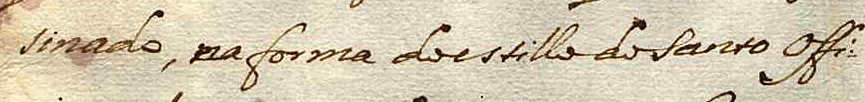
sinado, na forma do estillo do Santo Offi
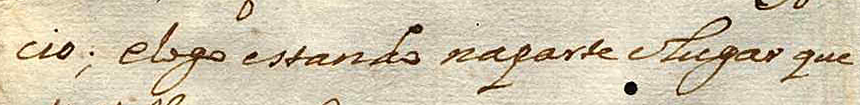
cio; e logo estando na parte e lugar que
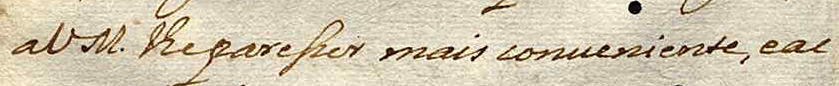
a VM. lhe paresser mais conueniente, e ac
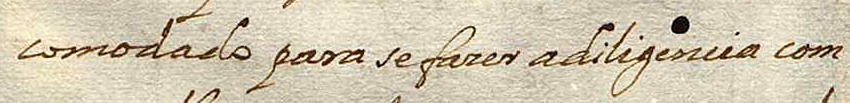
comodado para se fazer a diligencia com
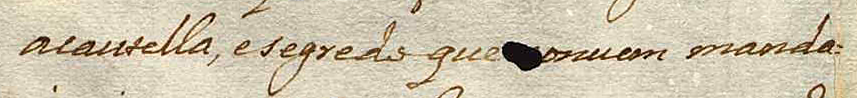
a cautella, e segredo que conuem manda
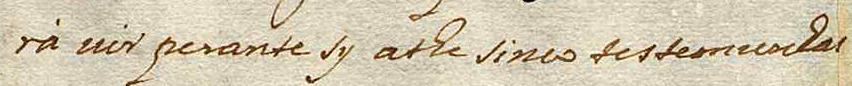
rà uir perante sy athe sinco testemunhas
